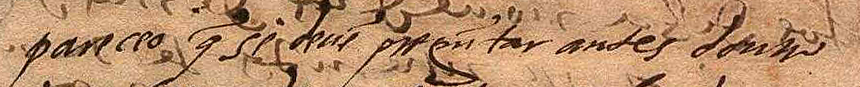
pareceo q̄ se deuē pregūtar antes doutro
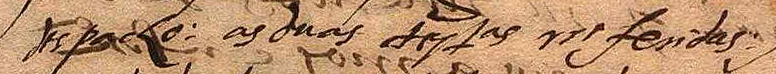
despacho as duas testas rreferidas:
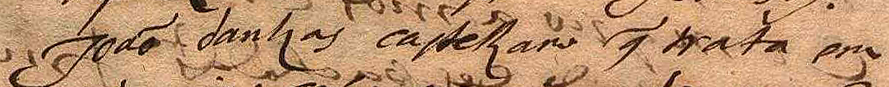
João danhas castelhano q̄ trata em
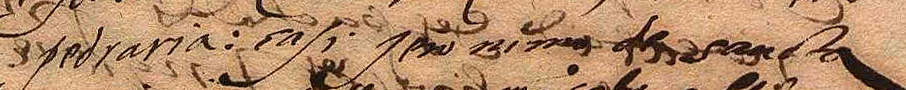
pedraria: E asi Jeronimo de sancta
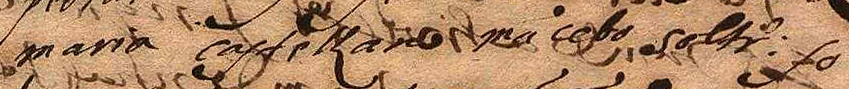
maria castelhano mācebo soltro so
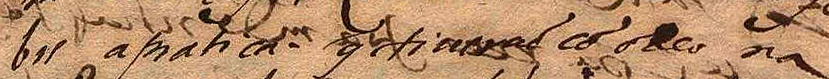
bre a pratica q̄ tiueraõ cō o Reo na
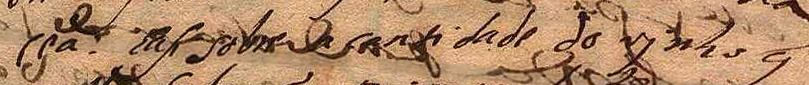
cea E asi sobre a cantidade do vjnho q̄
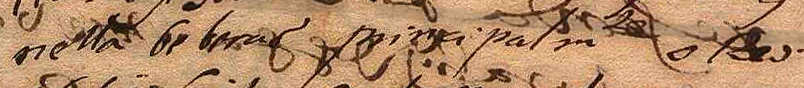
nella beberaõ principalmte o Reo
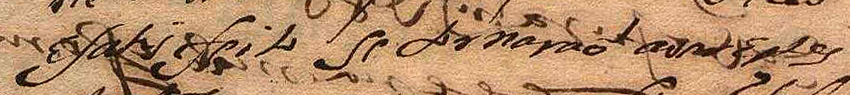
E satisfeito se tornaraõ a uer Estes
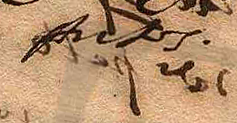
Autos
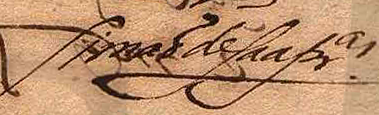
Simaõ de Saa pra.
